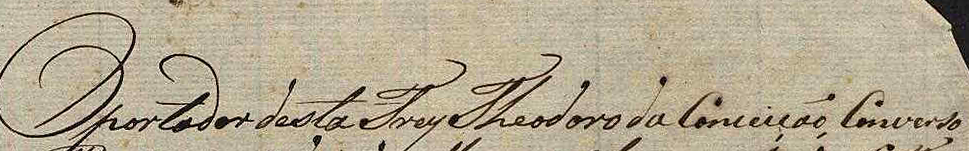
O portador desta Frey Theodoro da Conceiçaõ, Converso
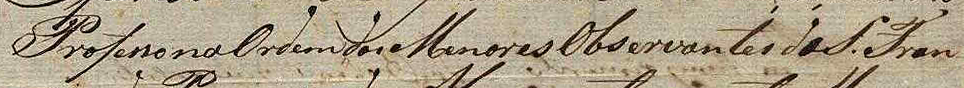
Professo na Ordem dos Menores Observantes de S. Fran
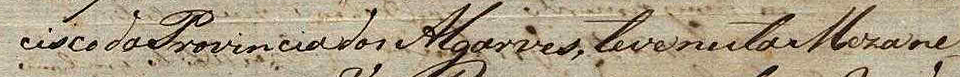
cisco da Provincia dos Algarves, teve nesta Meza ne
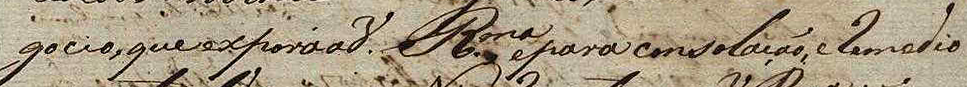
gocio, que exporá a V. R.ma e para consolaçaõ, e Remedio
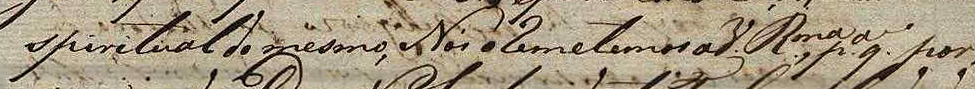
spiritual do mesmo, Nós o Remetemos a V. R.ma, p.a q̄ por
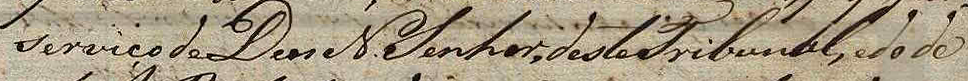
serviço de Deos N. Senhor, deste Tribunal, e do de
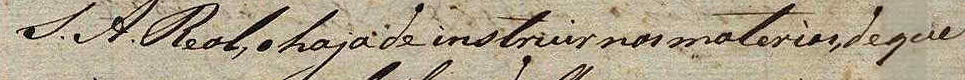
S. A. Real, o haja de instruir nas materias, de que
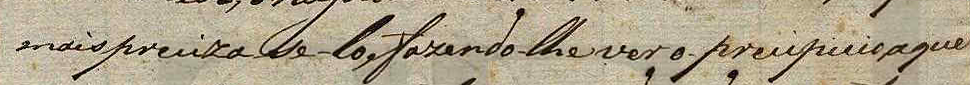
mais preciza se-lo, fazendo-lhe ver o precipicio, a que
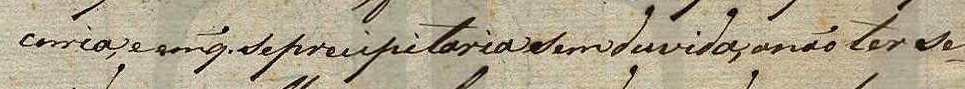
corria, e em q̄ se precipitaria sem duvida, o naõ ter se
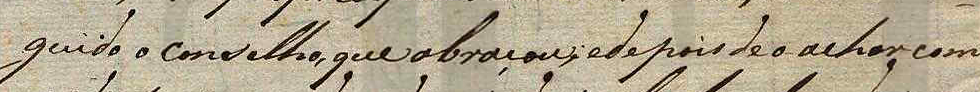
guido o conselho, que abraçou; e depois de o achar com
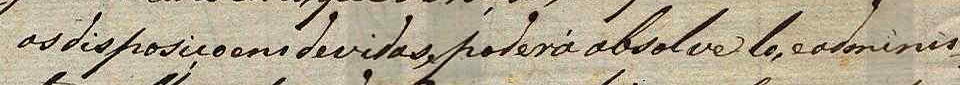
as disposiçoens devidas, poderá absolvelo, e adminis
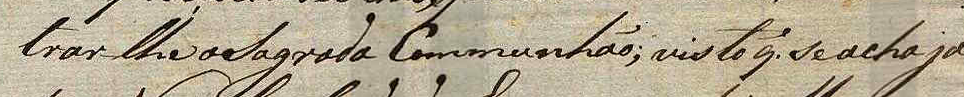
trar-lhe a Sagrada Communhaõ; visto q̄ se acha ja
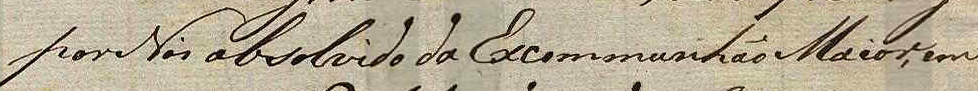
por Nós absolvido da Excommunhão Maior, em
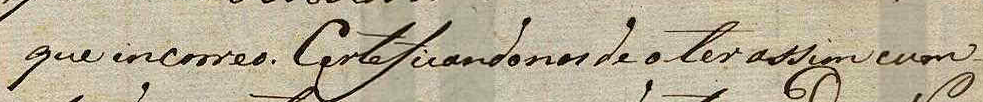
que incorreo. Certeficandonos de o ter assim cum
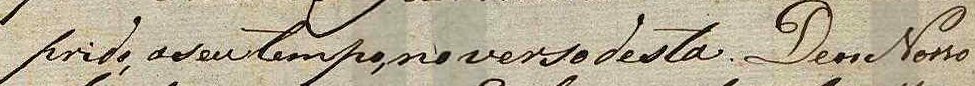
prido, o seu tempo, no verso desta. Deos Nosso
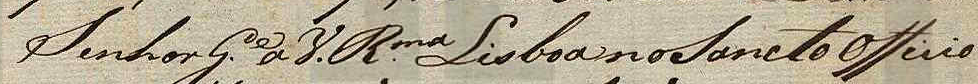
Senhor G.e a V. R.ma Lisboa no Sancto Officio
